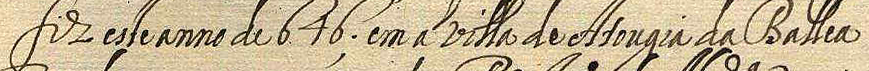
fiz este anno de 646; em a villa de Atougia da Ballea
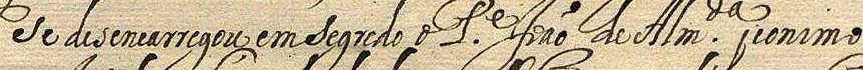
se desencarregou em Segredo o P.e Joaõ de Alm.da jconimo
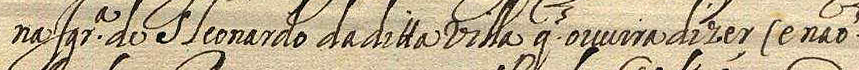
na Jgr.a de S Leonardo da ditta villa q̄ ouuira dizer, (e não
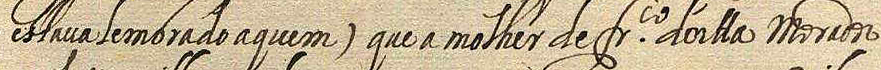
estaua lembrado a quem) que a molher de fr.co d'ortta morador
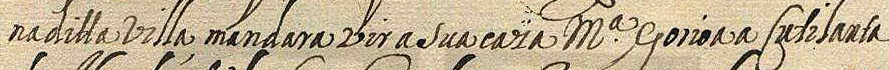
na ditta villa, mandara vir a sua caza M.a Gorioa a Cutilanta
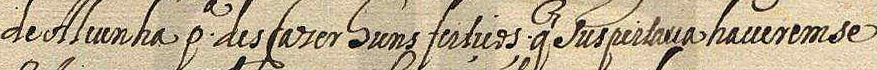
de Alcunha p.a desfazer huns feitiços; q̄ suspeitaua hauerese
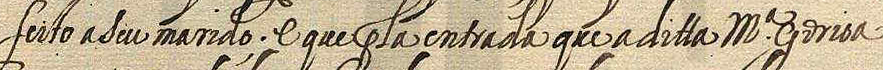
feito a seu marido; e que p̄la entrada que a ditta M.a Gorioa
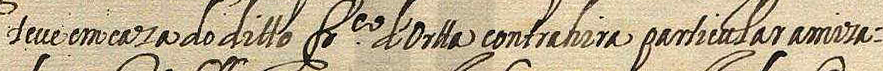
teue em caza do ditto fr.co d'Ortta contrahira particular amiza
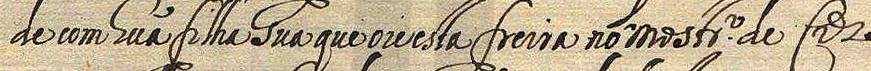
de com huā filha sua que oie esta freira no mostr.o de Coz
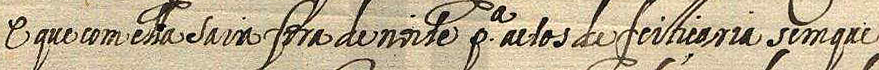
E que com ella saira fora de noite p.a actos de feitiçaria sem que
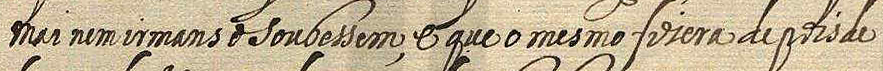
mai nem irmans o soubessem, e que o mesmo fizera depois de
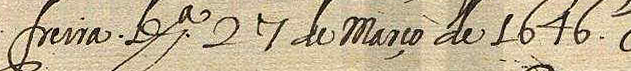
freira. Lxa. 27 de Março de 1646.
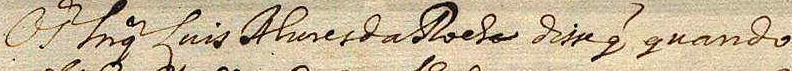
O sor Inqor Luis Alures da Rocha disse q̄ quando
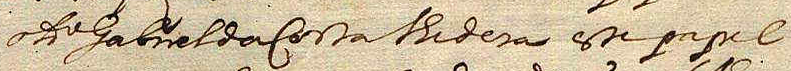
o ldo Gabriel da Costa lhe dera este papel
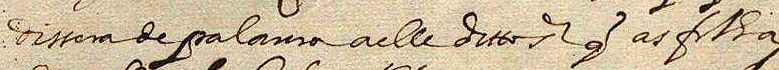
dissera de palaura a elle ditto sor q̄ as filhas
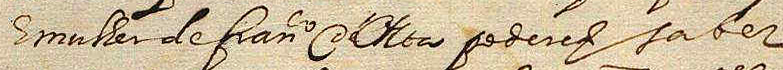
E mulher de franco d'Orta poderaõ saber
